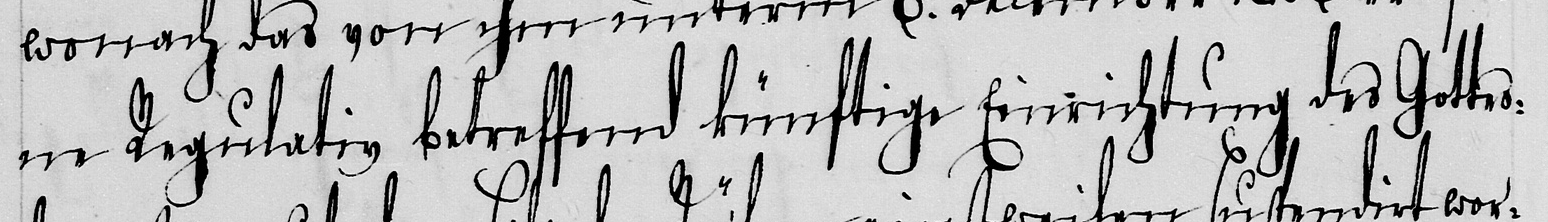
ne Regulativ betreffend künftige Einrichtung des Gotte¬
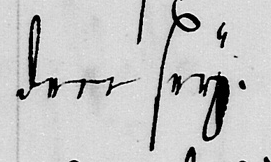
den sey.
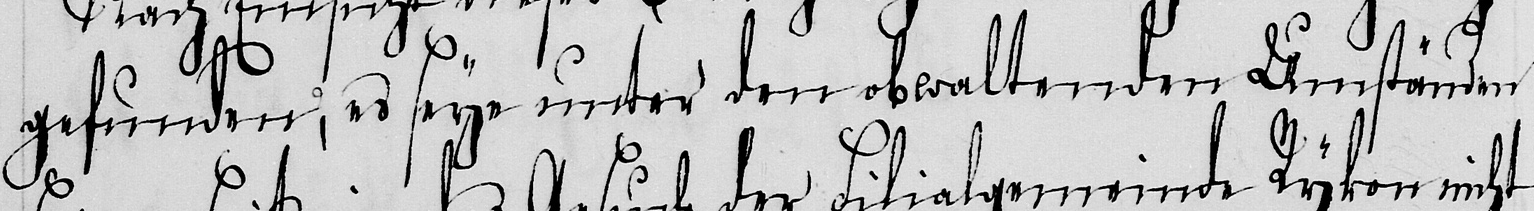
gefunden, es seye unter den obwaltenden Umständen
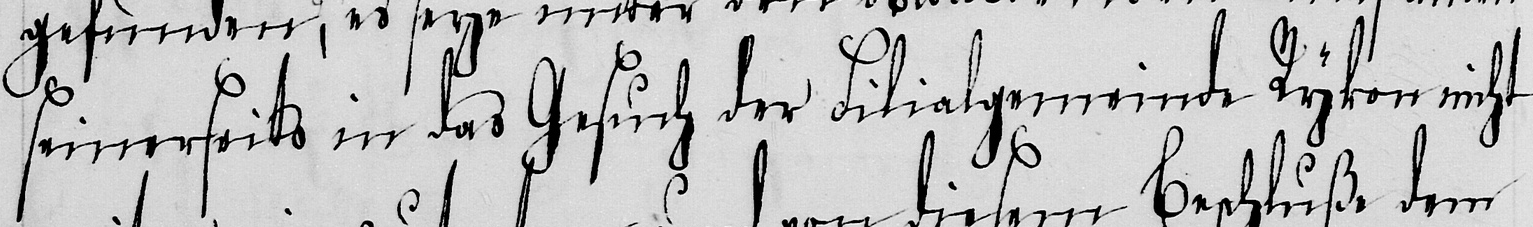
seinerseits in das Gesuch der Filialgemeinde Rykon nicht
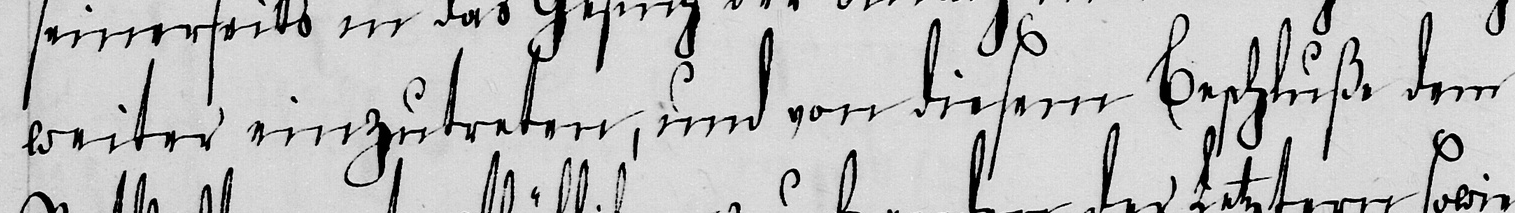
weiter einzutreten, und von diesem Beschluße dem
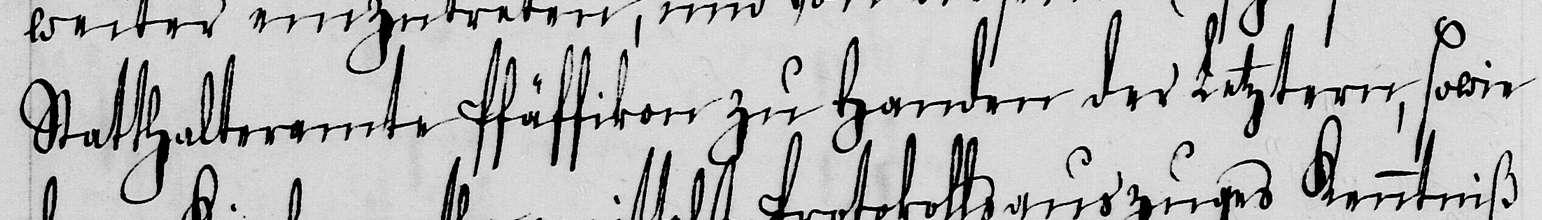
Statthalteramte Pfäffikon zu Handen der Letztern, sowie
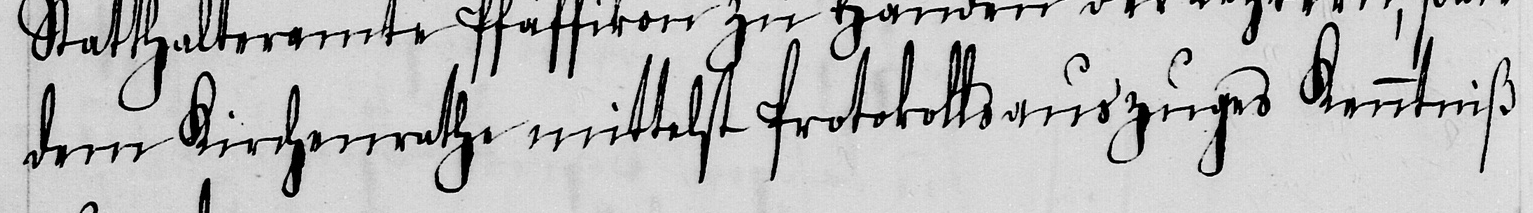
dem Kirchenrathe mittelst Protokollsauszuges Kenntniß
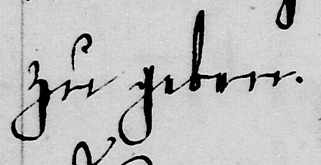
zu geben.
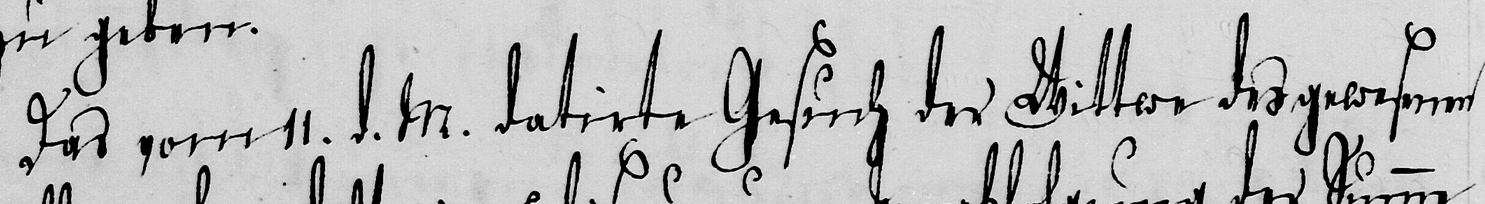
Das vom 11. d. M. datirte Gesuch der Wittwe des gewe¬
